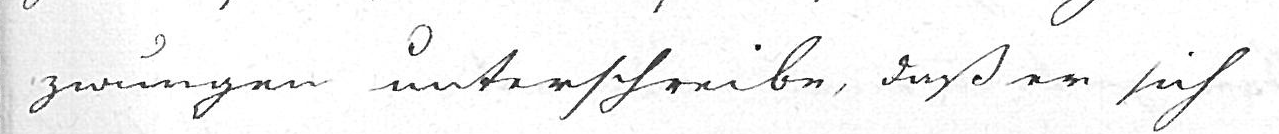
zwungen unterschreibe, daß er sich
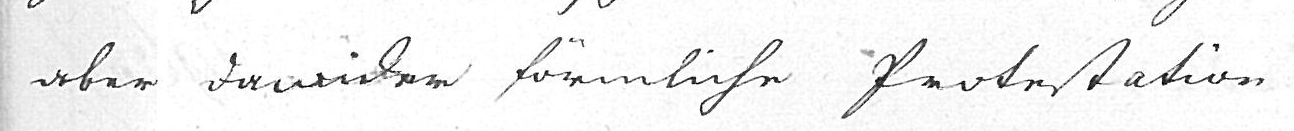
aber dawider förmliche Protestation
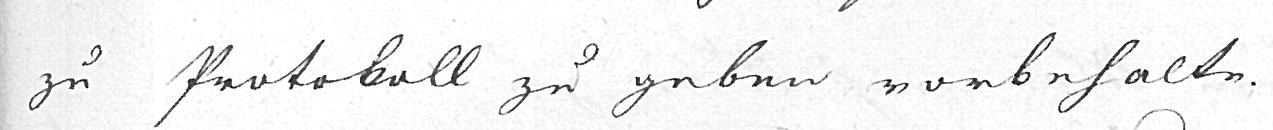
zu Protokoll zu geben vorbehalte.
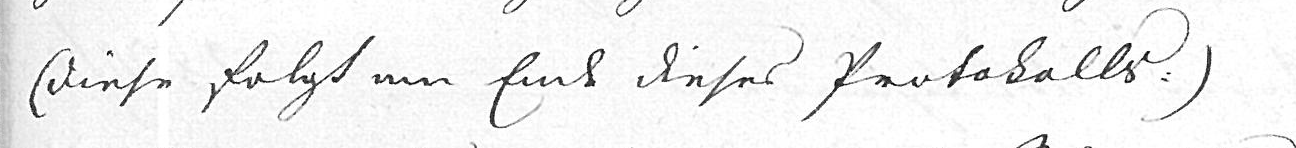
(diese folgt am Ende dieses Protokolls:)
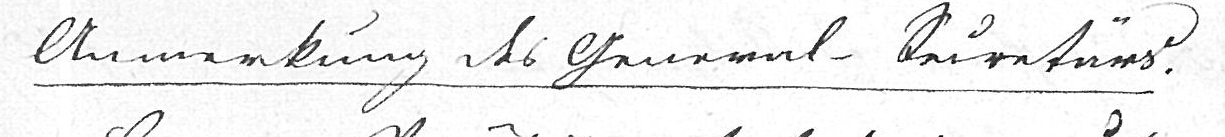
Anmerkung des General-Secretärs.
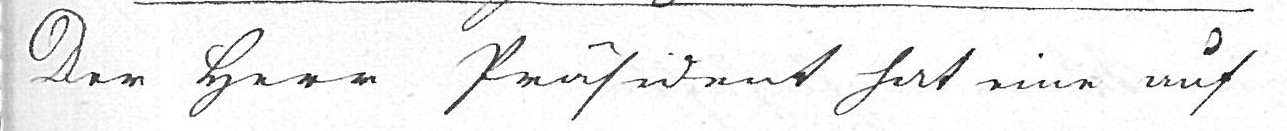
Der Herr Präsident hat eine auf
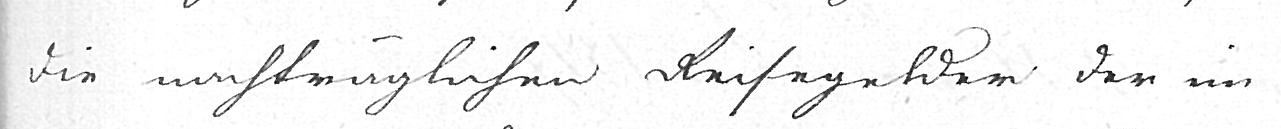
die nachträgliche Reisegelder der im
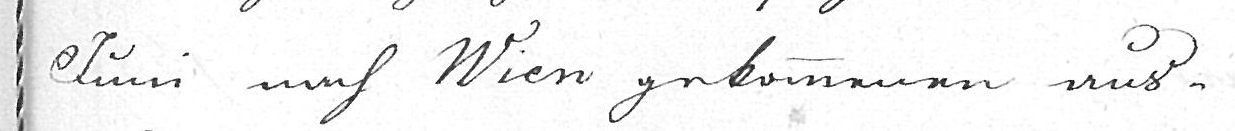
Juni nach Wien gekommenen aus-
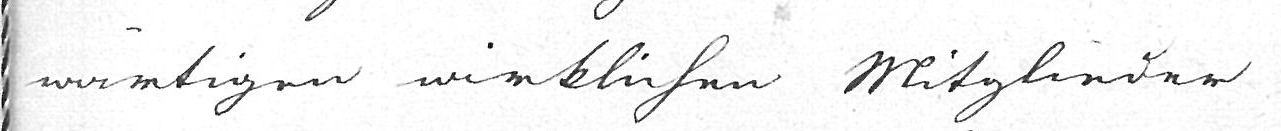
wärtigen wirklichen Mitglieder
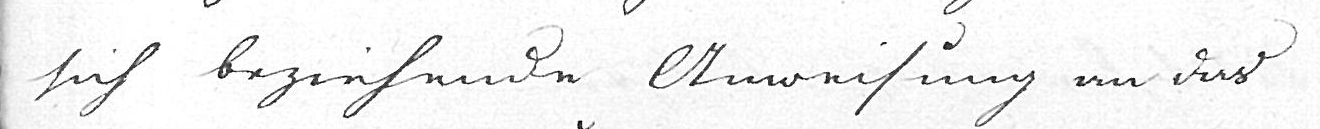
sich beziehende Anweisung an das
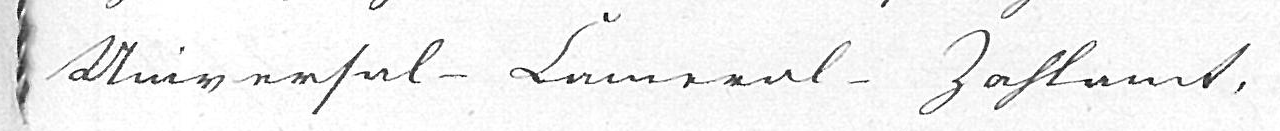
Universal-Cameral-Zahlamt
